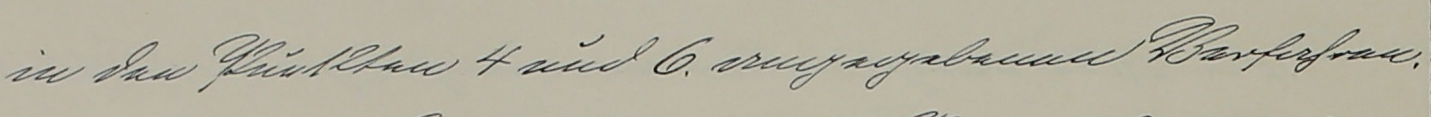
in den Punkten 4 und 6. angegebenen Verfahren.
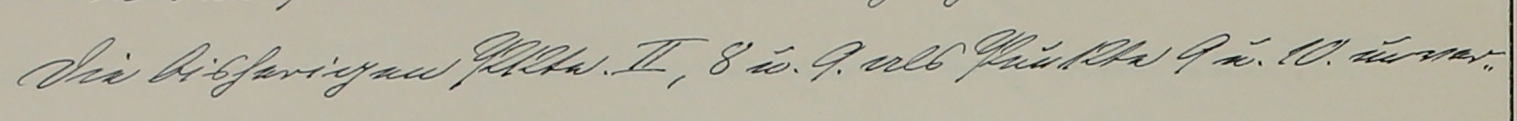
Die bisherigen Pkte. II,8 u. 9. als Punkte 9 u. 10. unver-
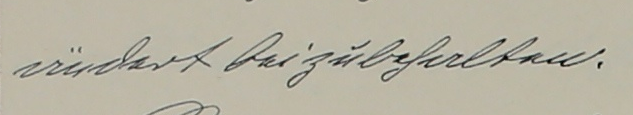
ändert beizubehalten.
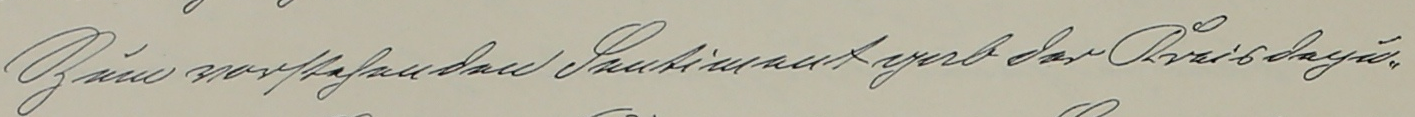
Zum vorstehenden Sentiment gab der Kreisdepu-
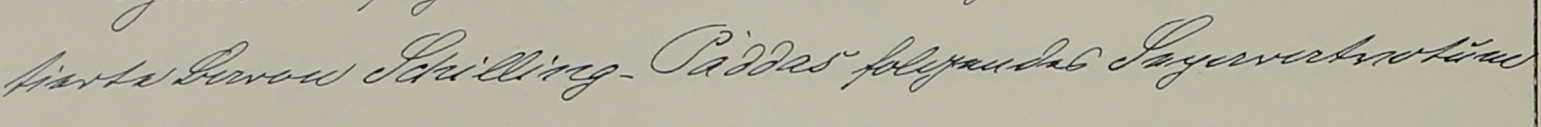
tierte Baron Schilling-Paddas folgendes Separatvotum
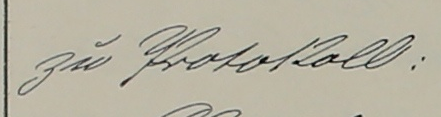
zu Protokoll:
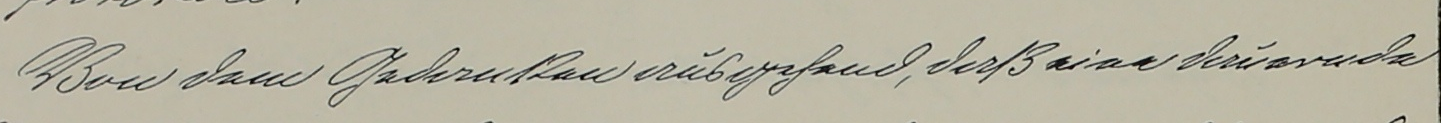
Von dem Gedanken ausgehend, daß eine dauernde
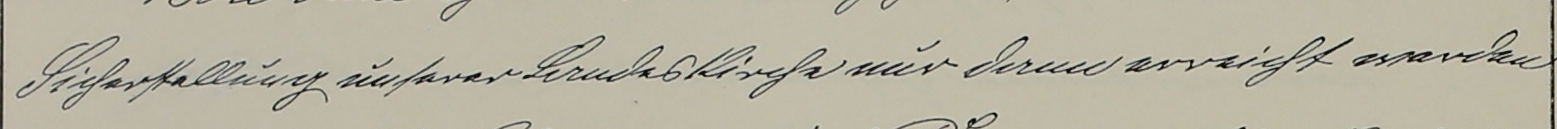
Sicherstellung unserer Landeskirche nur dann erreicht werden
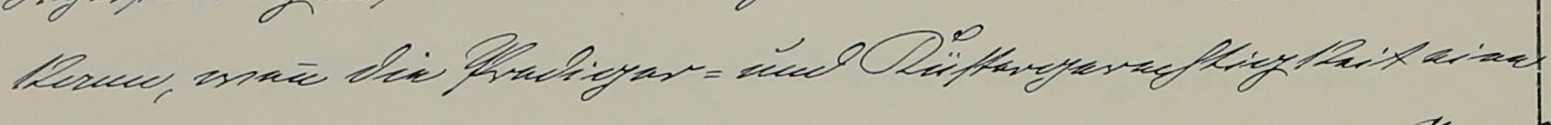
kann, wenn die Prediger- und Küstergerechtigkeit eine
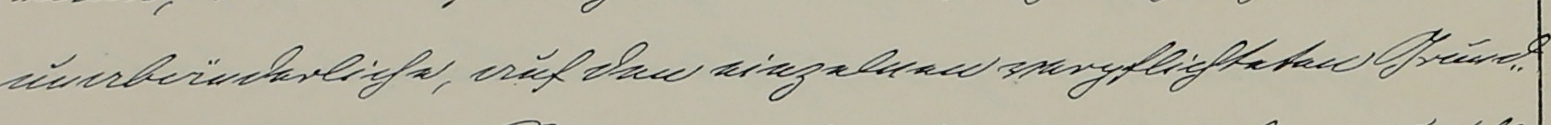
unabänderliche, auf den einzelnen verpflichteten Grund-
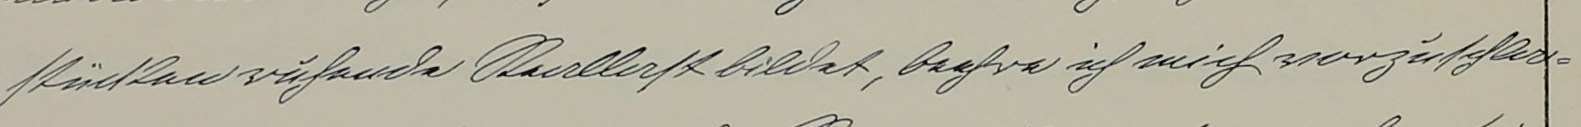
stücken ruhende Reallast bildet, beehre ich mich vorzuschla-
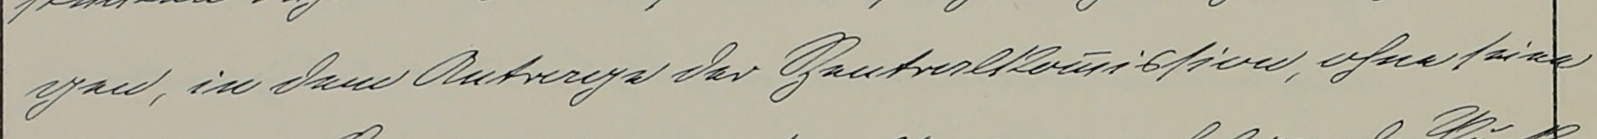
gen, in dem Antrage der Zentralkommission, ohne seine
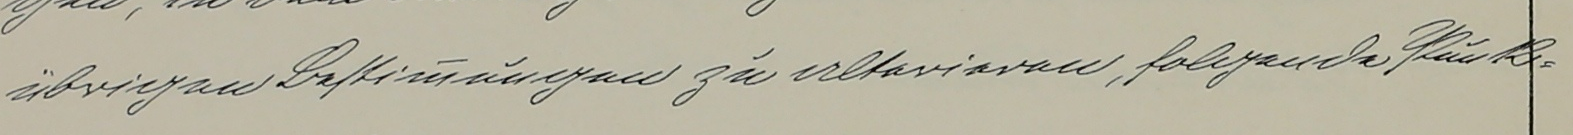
übrigen Bestimmungen zu alterieren, folgende Punk-
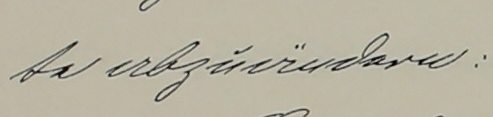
te abzuändern:
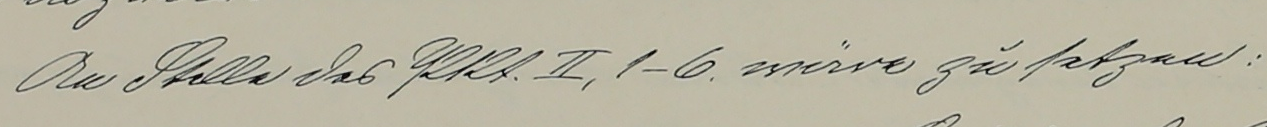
An Stelle des Pkt. II.1-6. wäre zu setzen:
